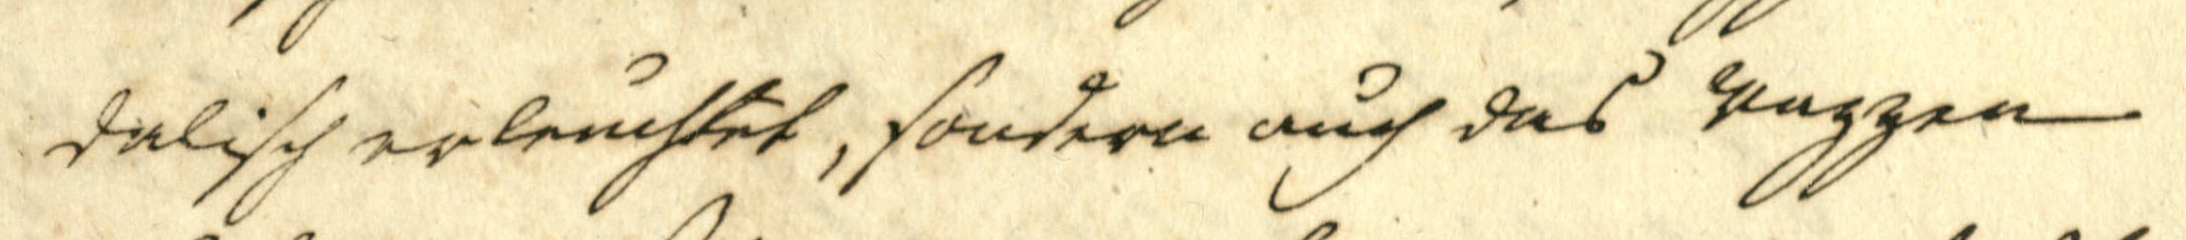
dalisch erleuchtet, sondern auch das Wappen
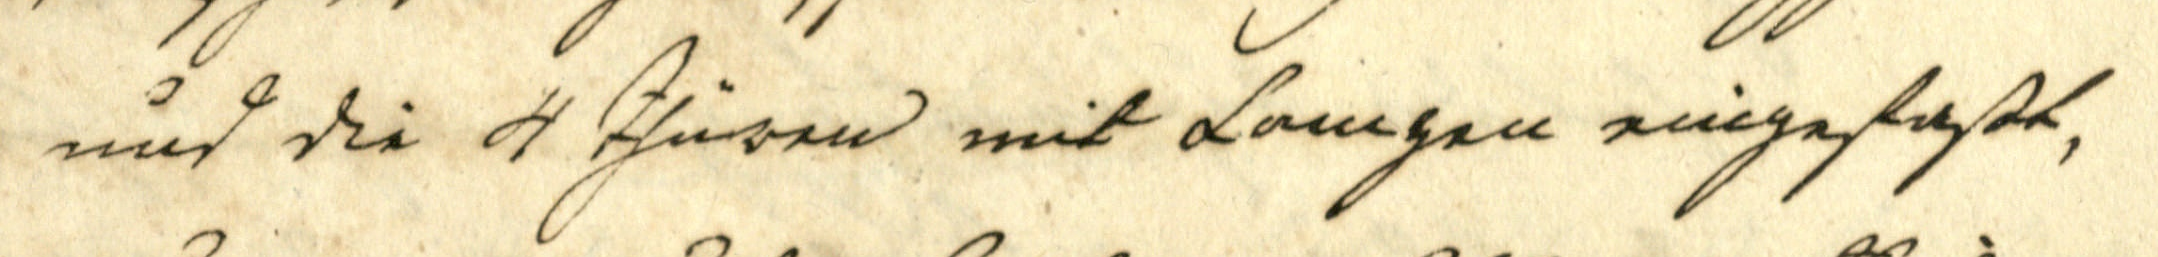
und die 4 Thüren mit Lampen eingefaßt,
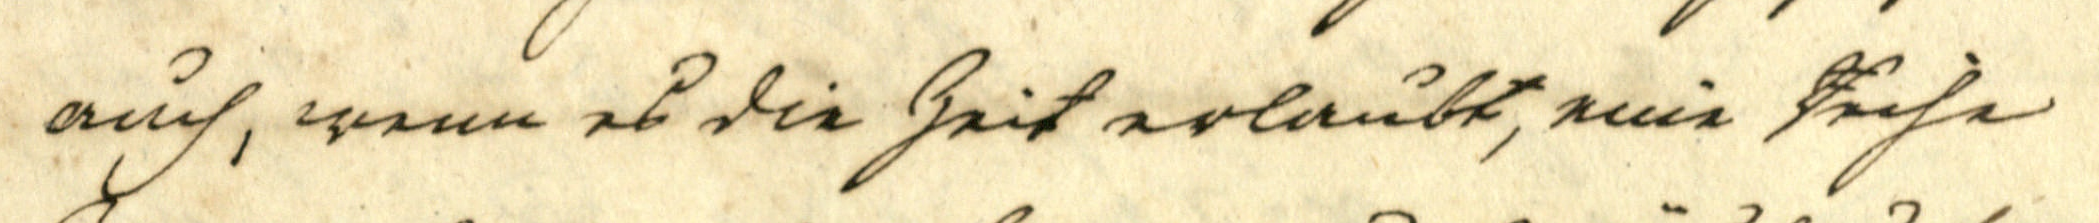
auch, wenn es die Zeit erlaubt, eine Reihe
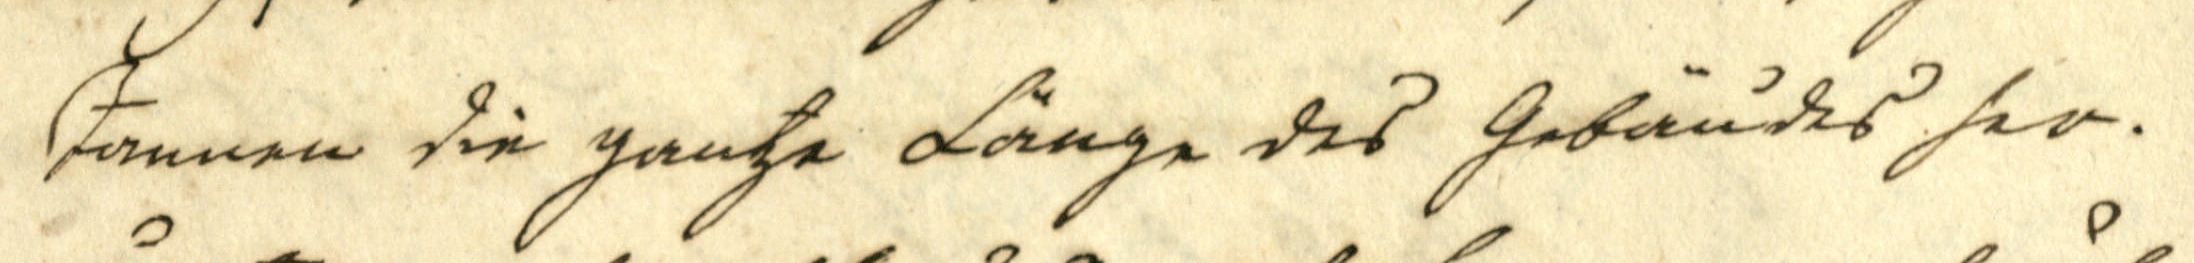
Tannen die gantze Länge des Gebäudes her¬
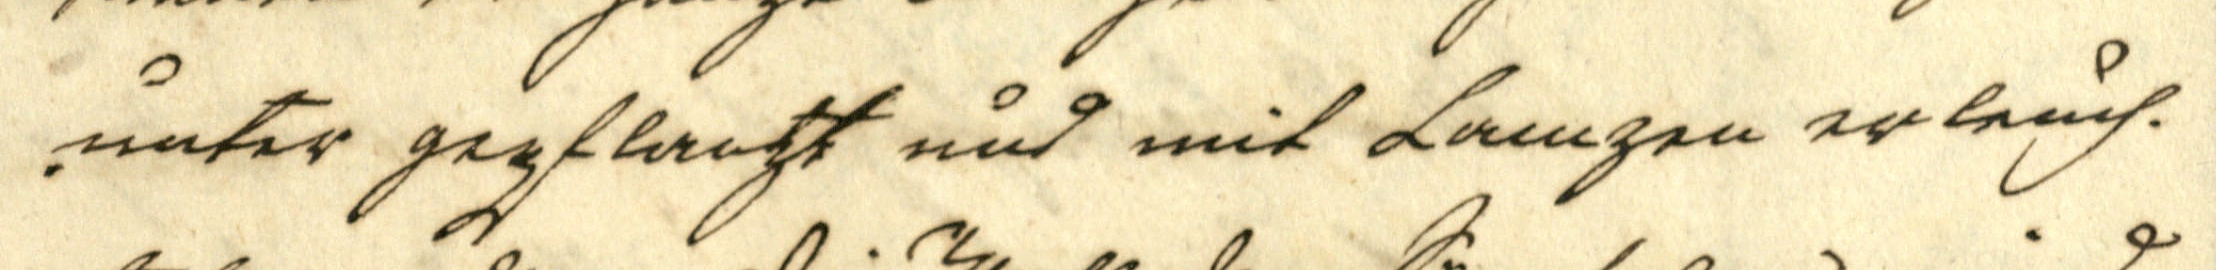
unter gepflanzt und mit Lampen er leuch¬
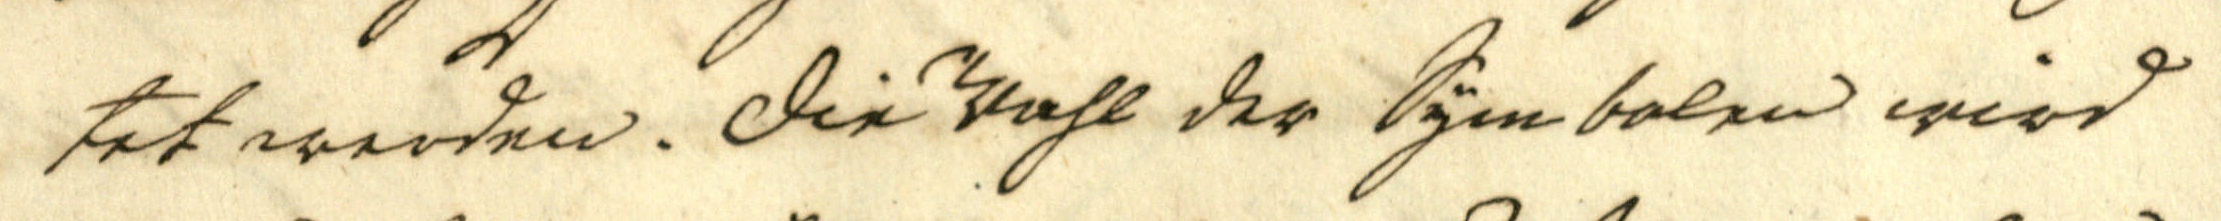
tet werden. Die Wahl der Sÿmbolen wird
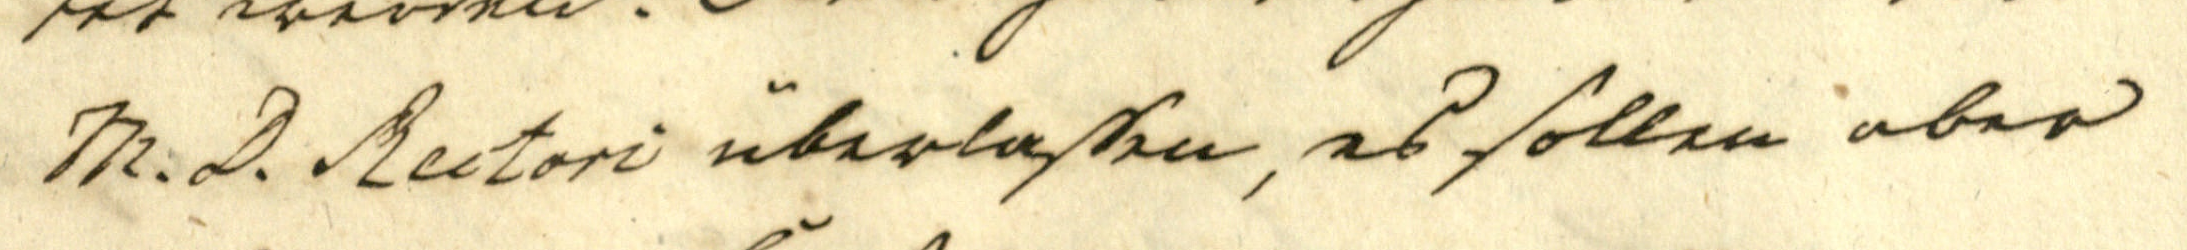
M. D. Rectori überlassen, es sollen aber
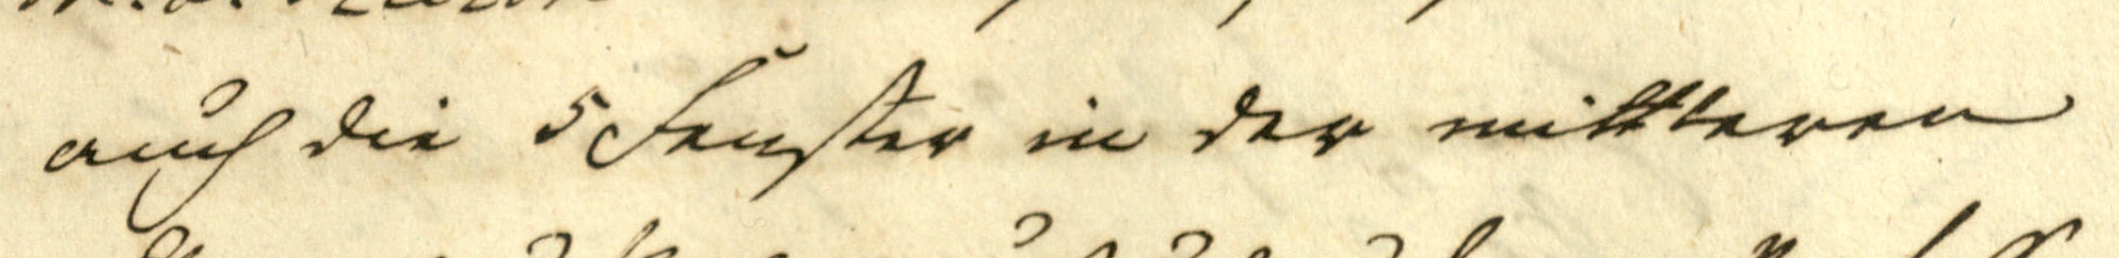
auch die 5 Fenster in der mittleren
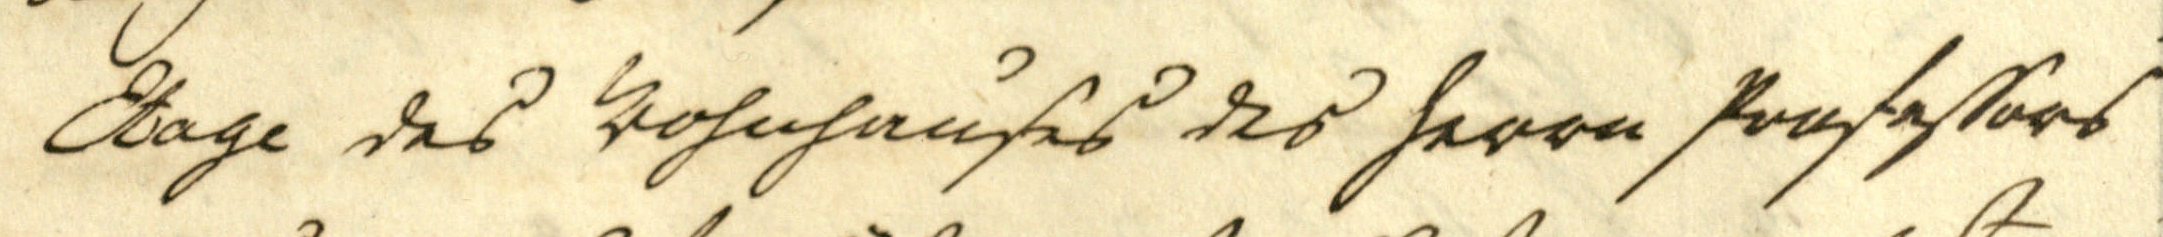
Etage des Wohnhauses des Herrn Professors
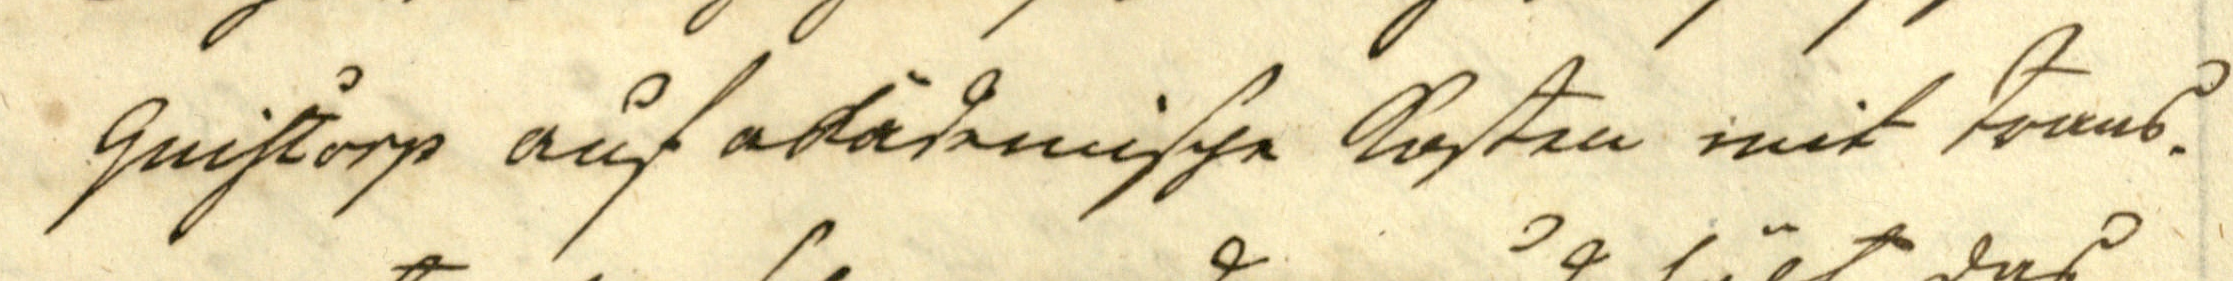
Quistorp auf akademische Kosten mit Trans¬
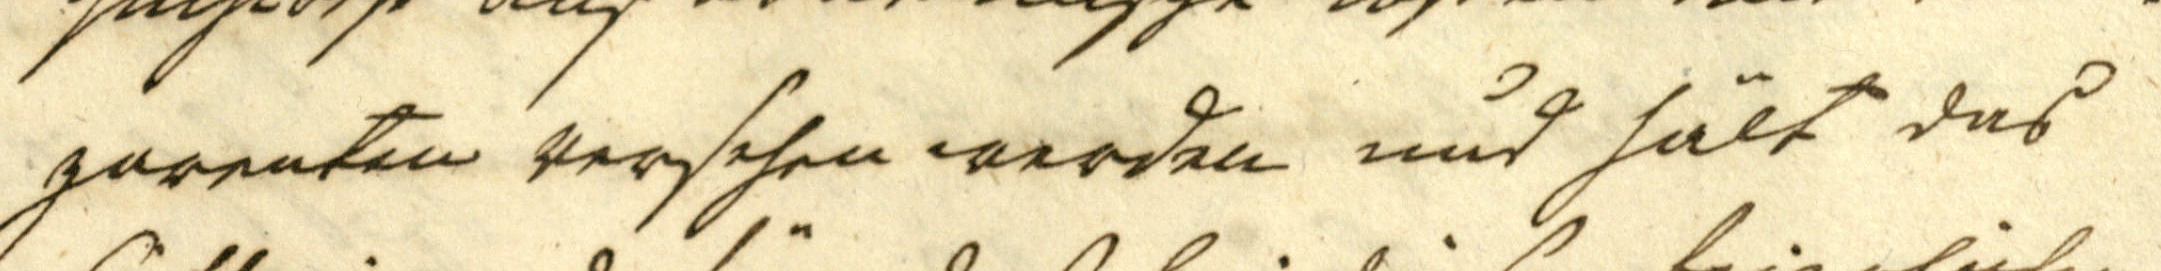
parenten versehen werden und hält das
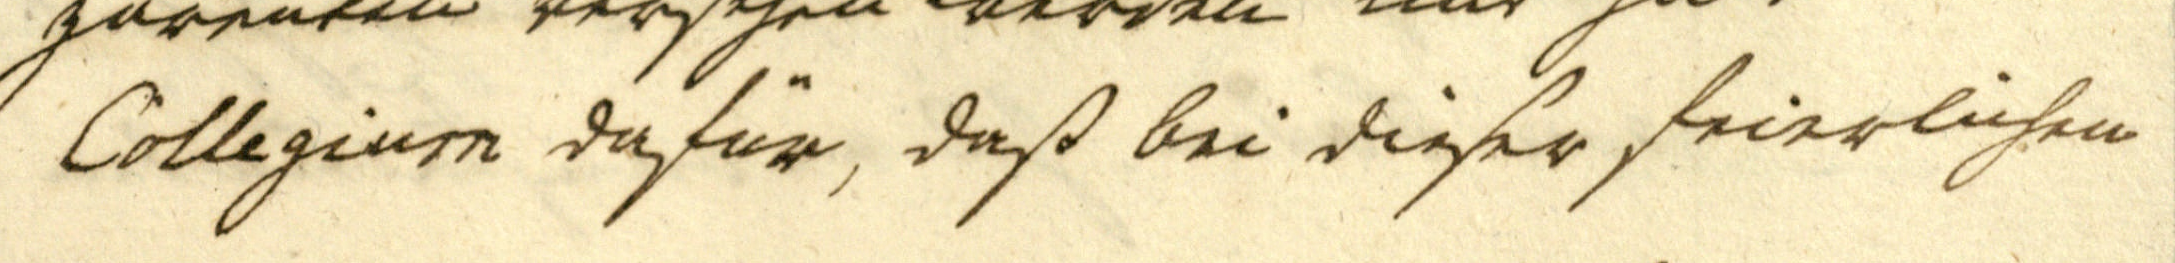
Collegium dafür, daß bei dieser feierlichen
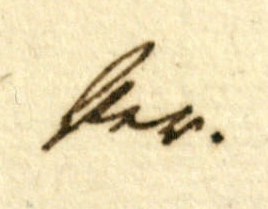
Ver.
